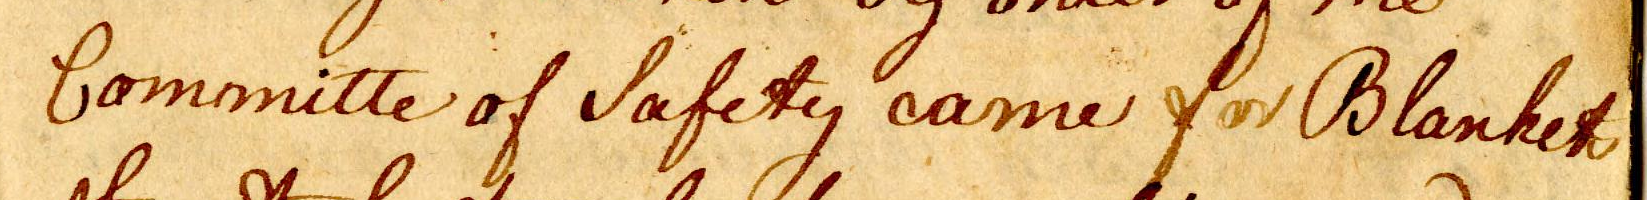Committe of Safety came for Blankets
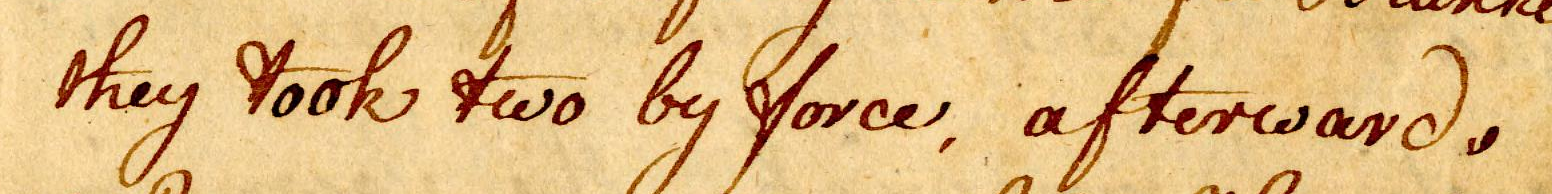they took two by force, afterwards
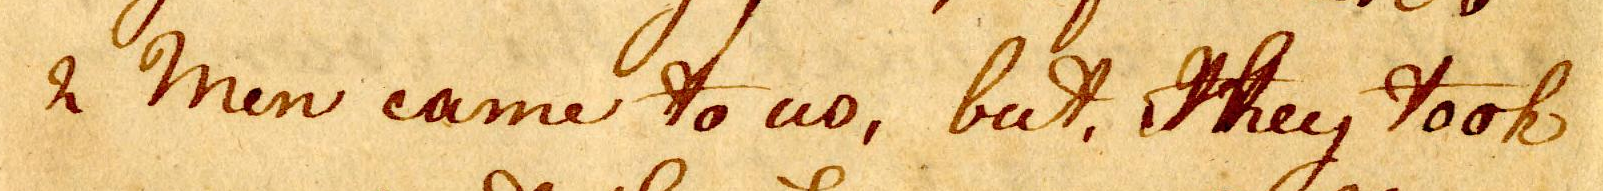2 Men came to us, but, they took
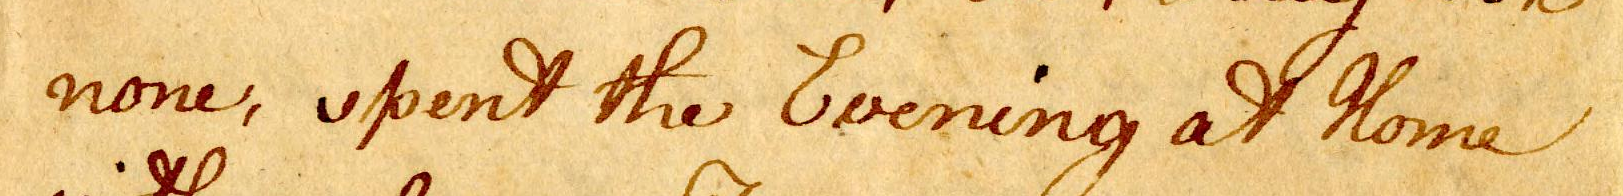none, spent the Evening at Home
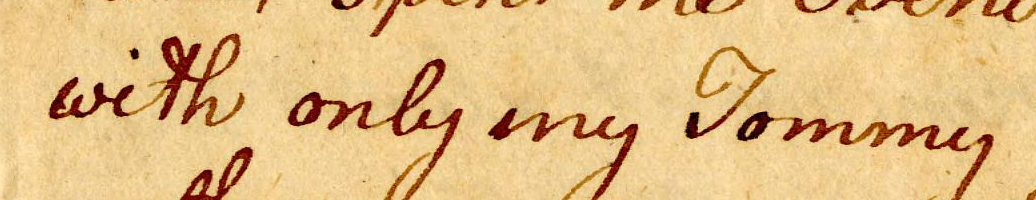with only my Tommy
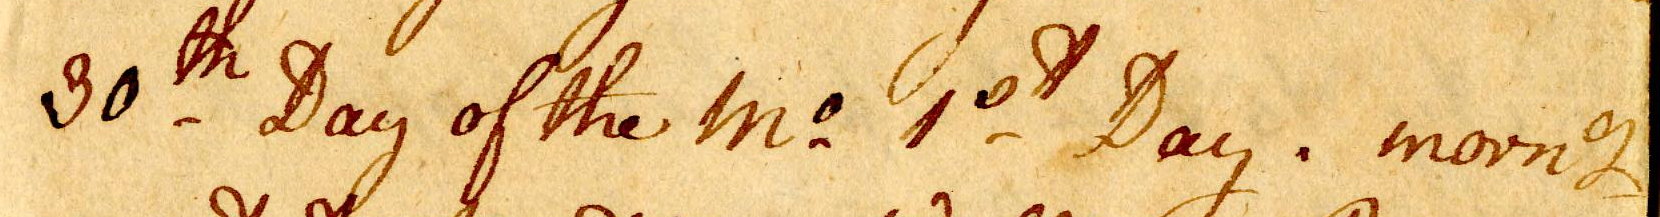30^th Day of the M^o 1^st Day. morn^g
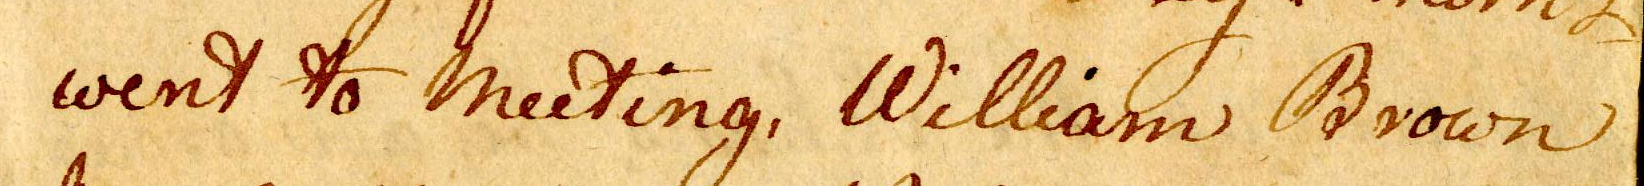went to Meeting, William Brown
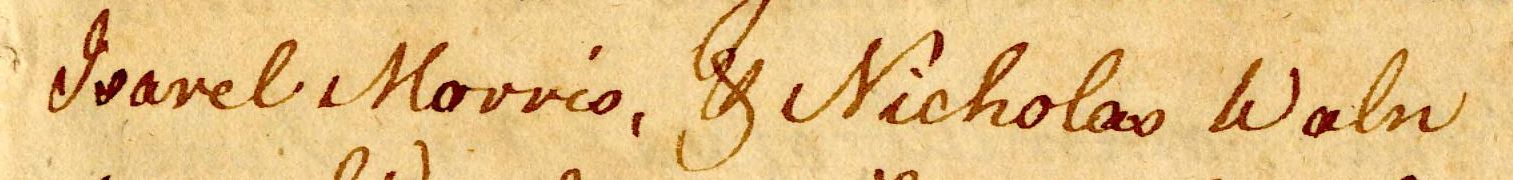Isarel Morris, & Nicholas Waln
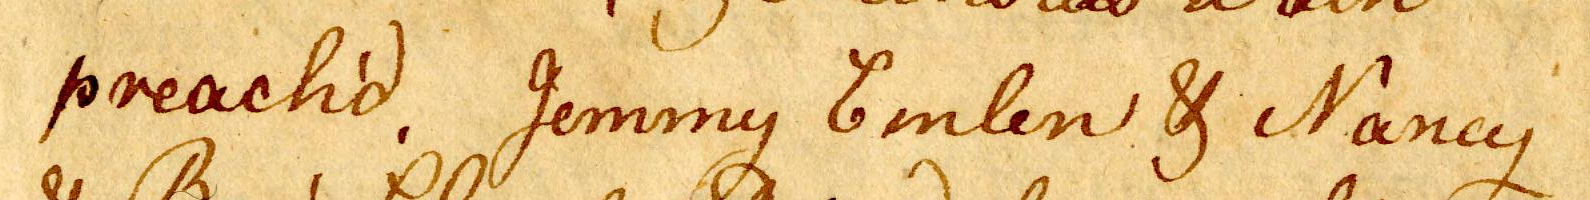preach'd, Jemmy Emlen & Nancy
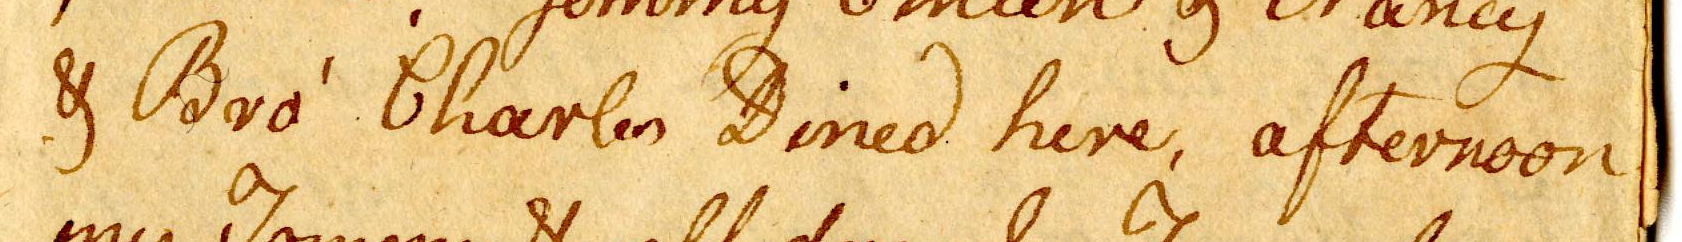& Bro' Charles Dined here, afternoon
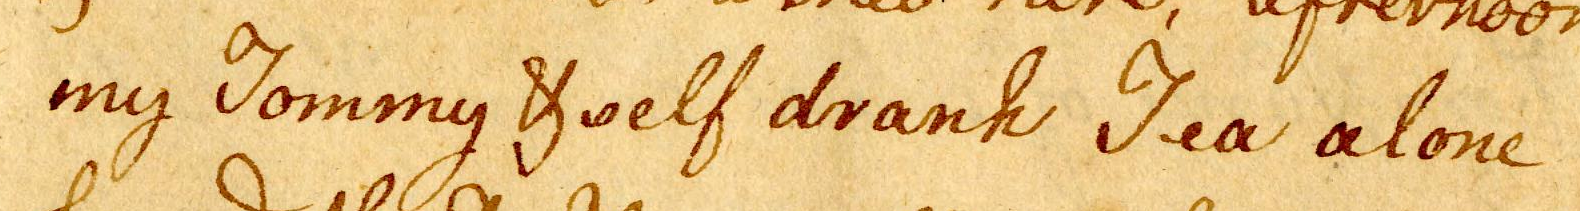my Tommy & self drank Tea alone
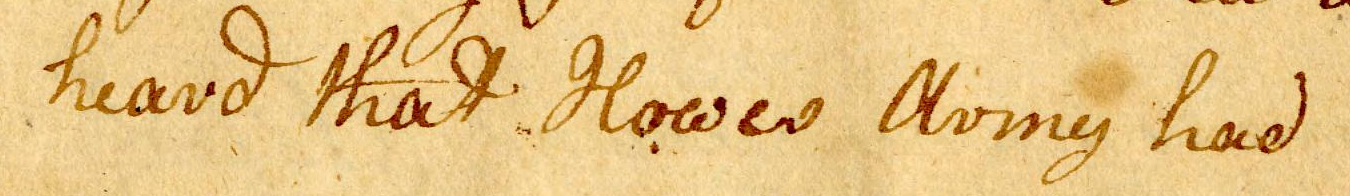heard that Howes Army had
